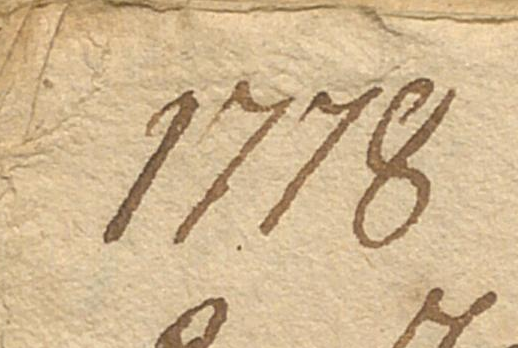1778
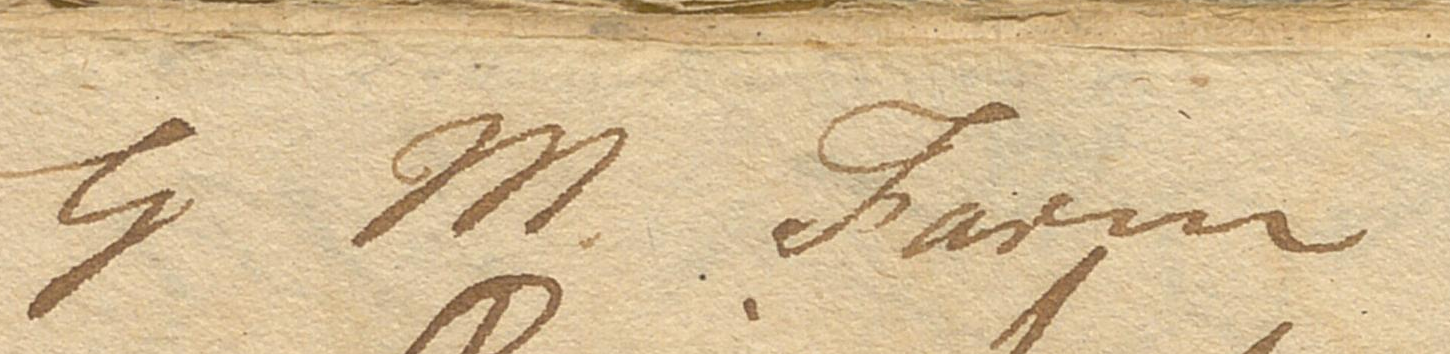G. M. Farm
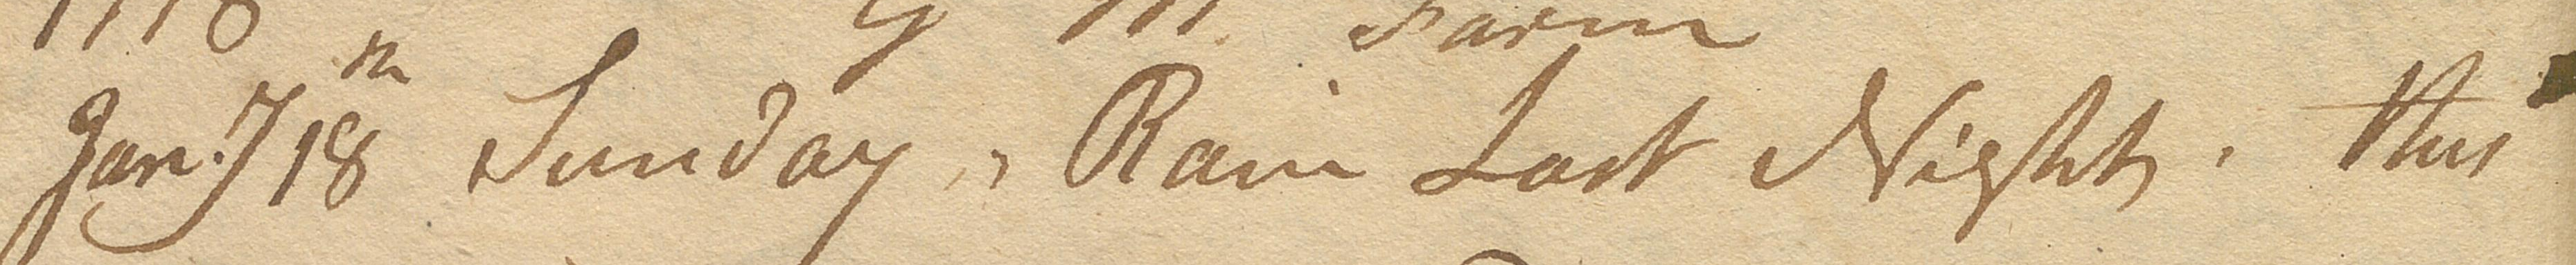Jan^y. 18 ^th Sunday. Rain Last Night. This
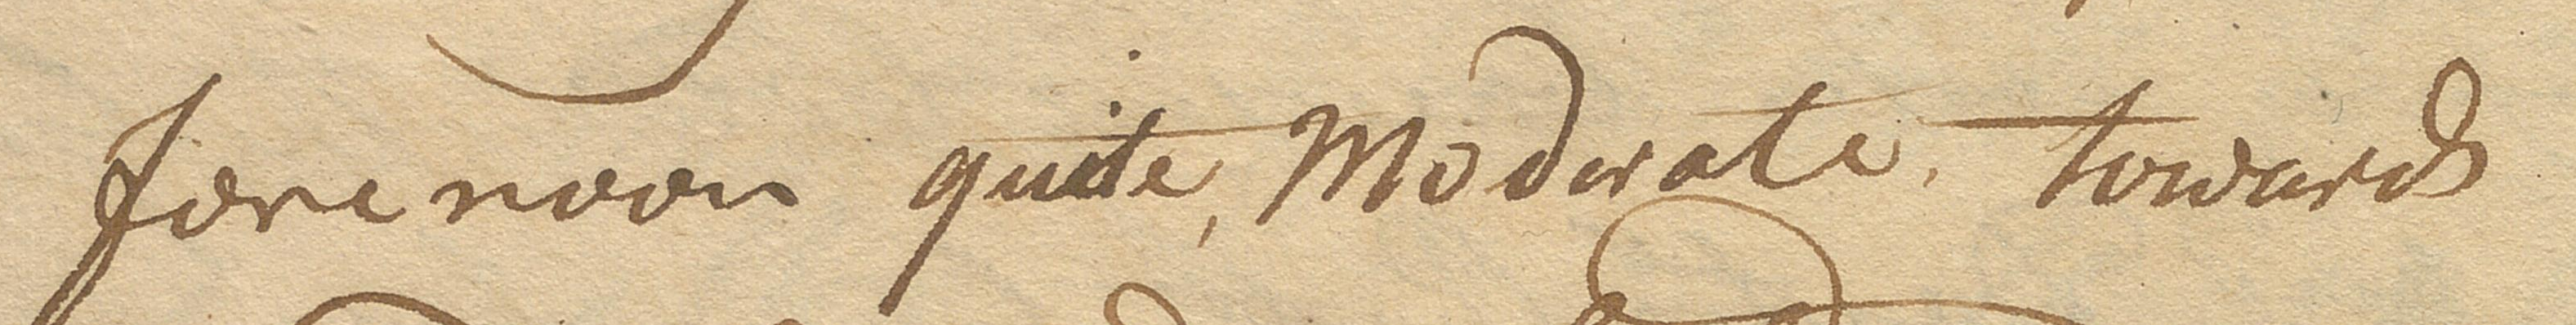forenoon quite, Moderate towards
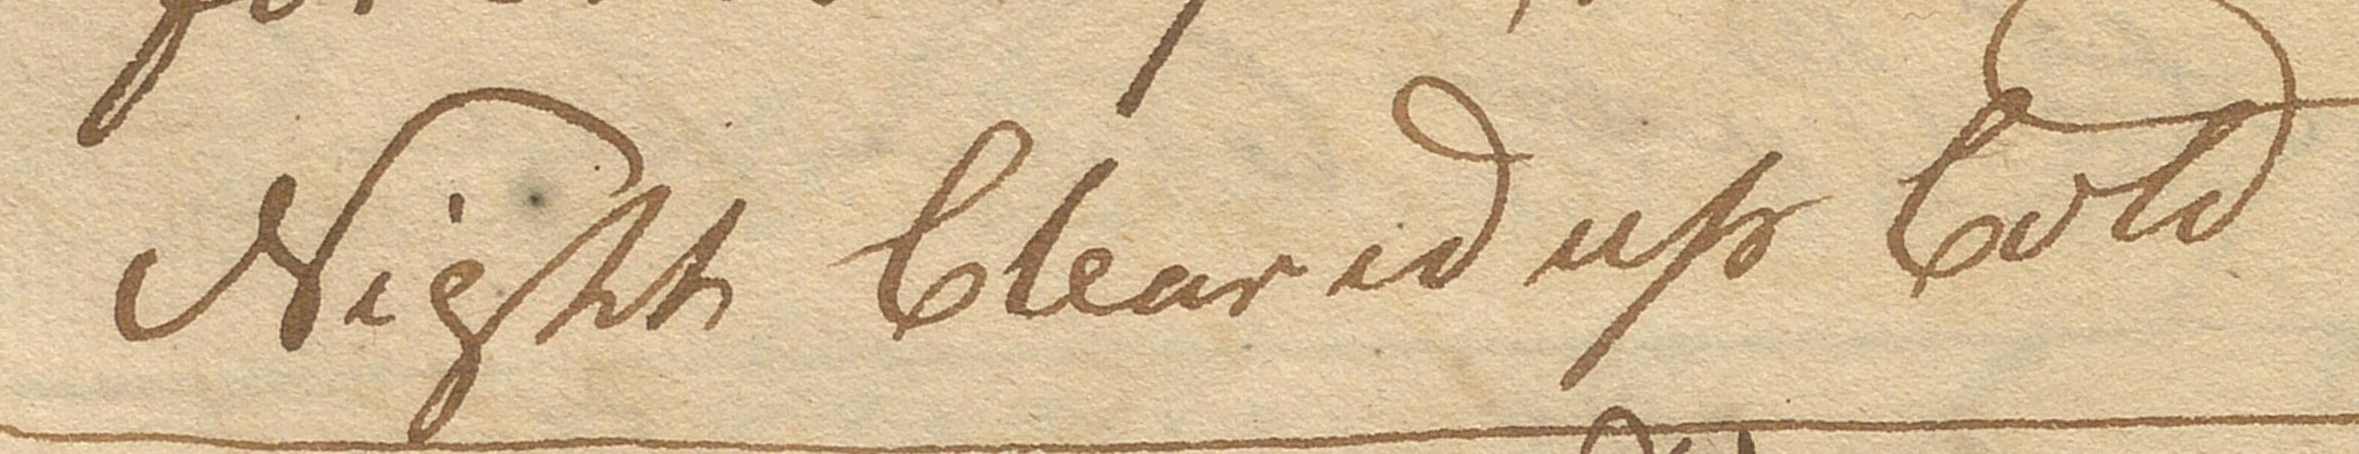Night Cleared up Cold
